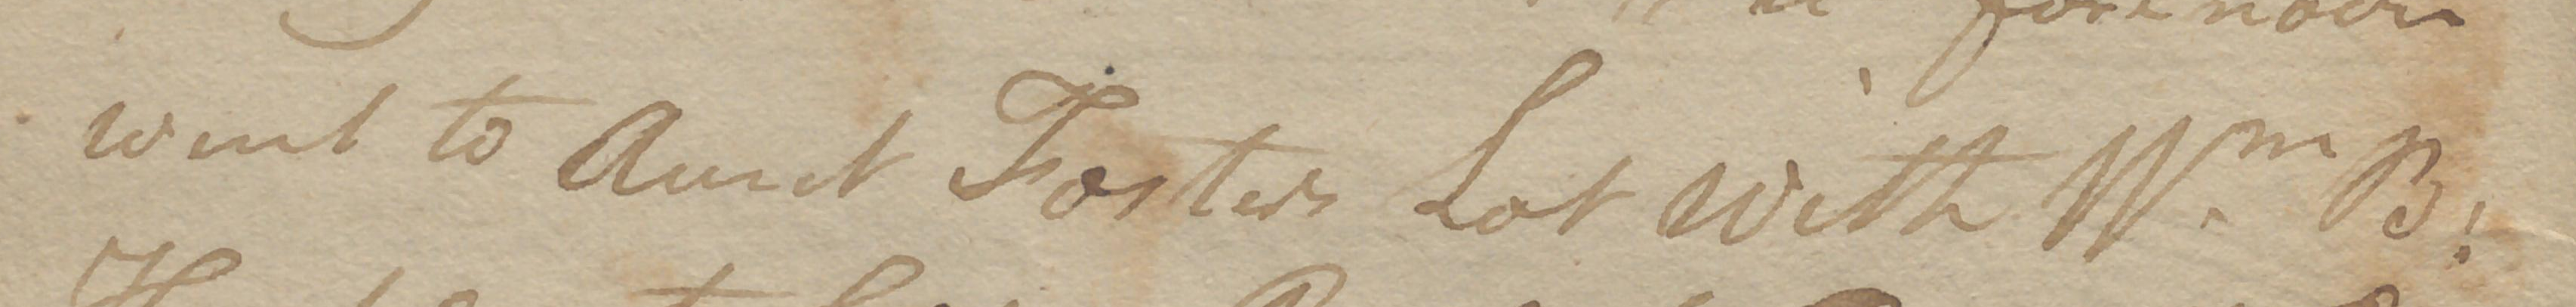went to Aunt Fosters Lot with W^m. B.
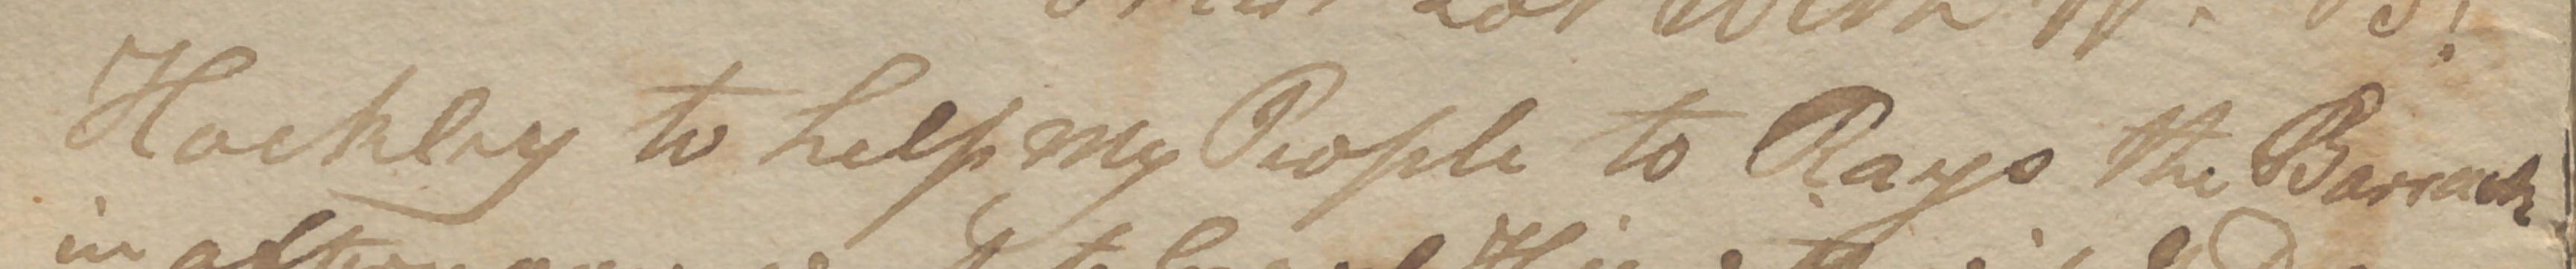Hackley to help My People to Rays the Barrack
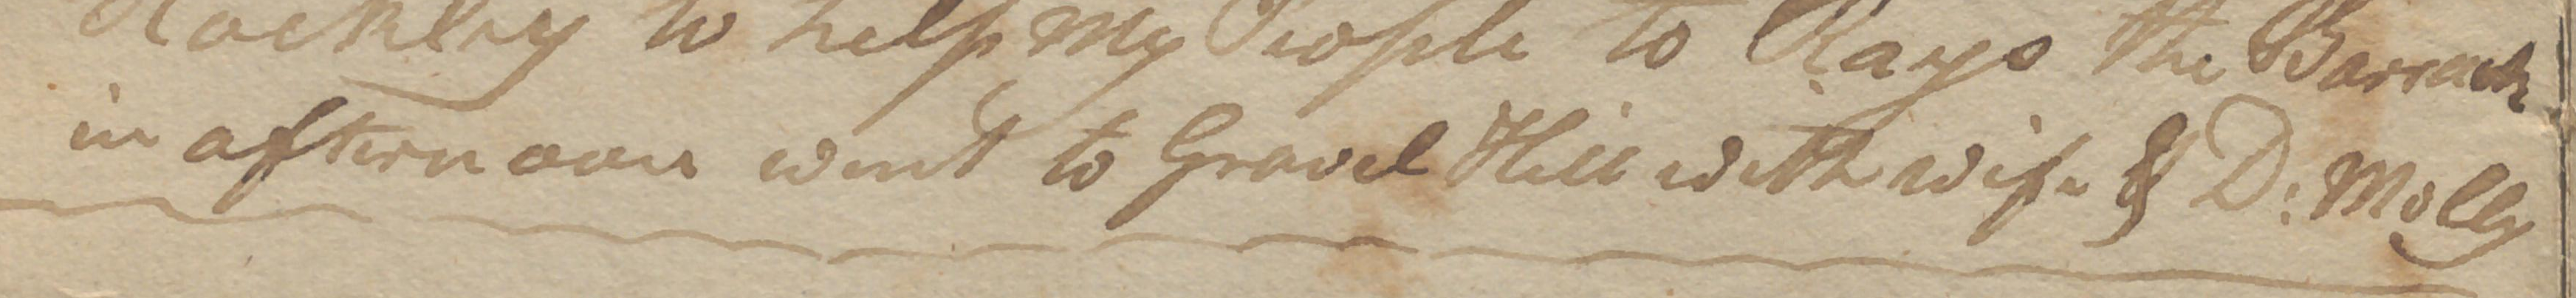in afternoon went to Gravel Hill with wife & D: Moly
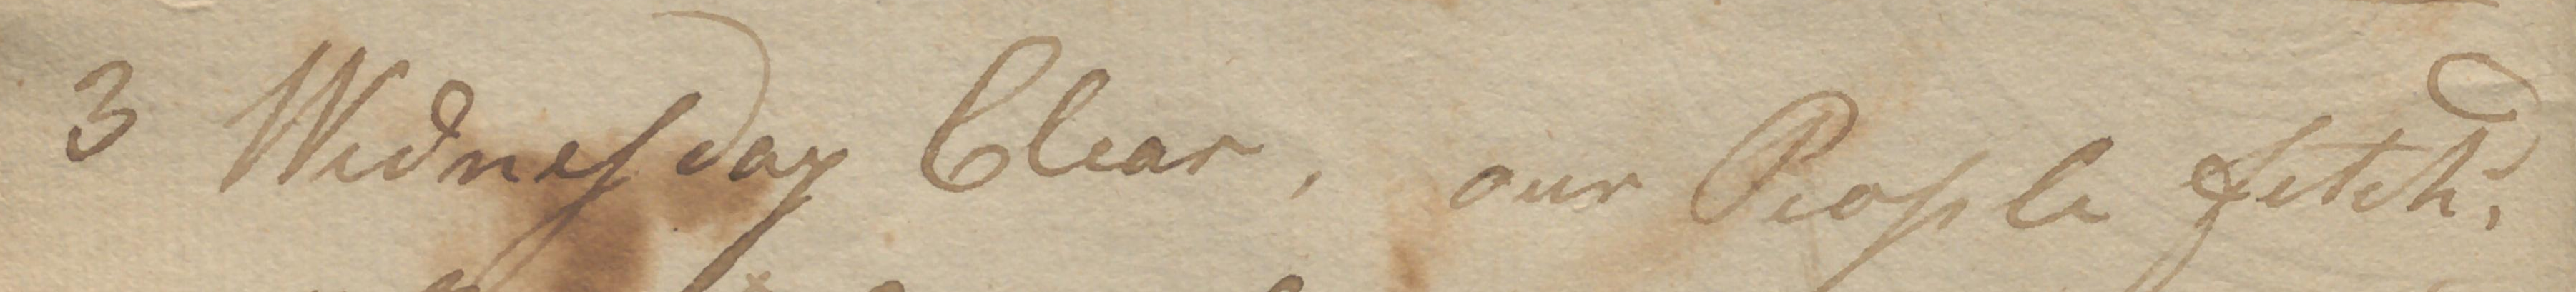3 Wednesday Clear, our People fetch^d.
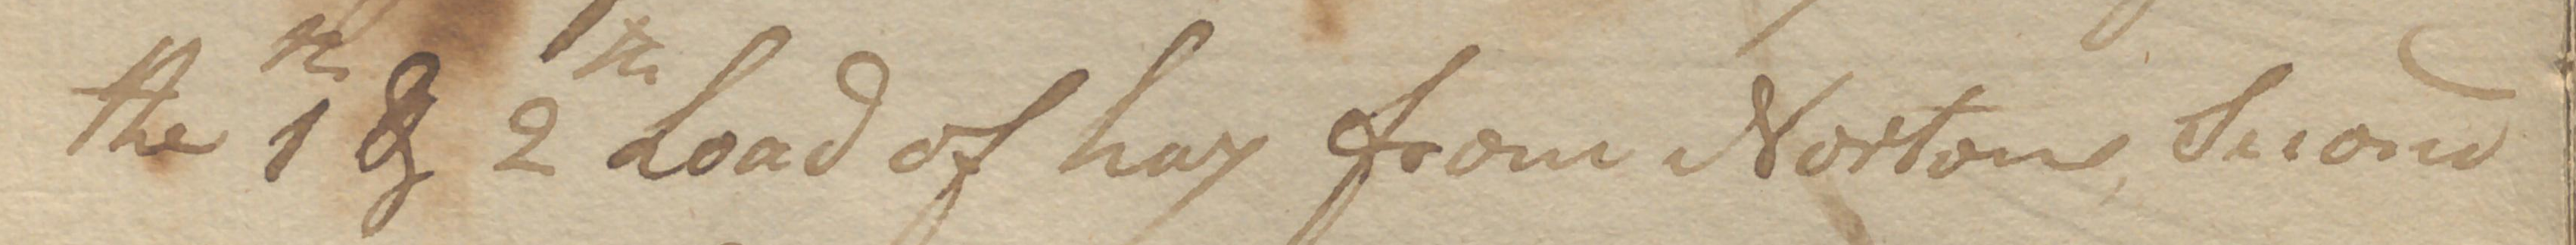the 1^th & 2^th Load of hay from Nortons second
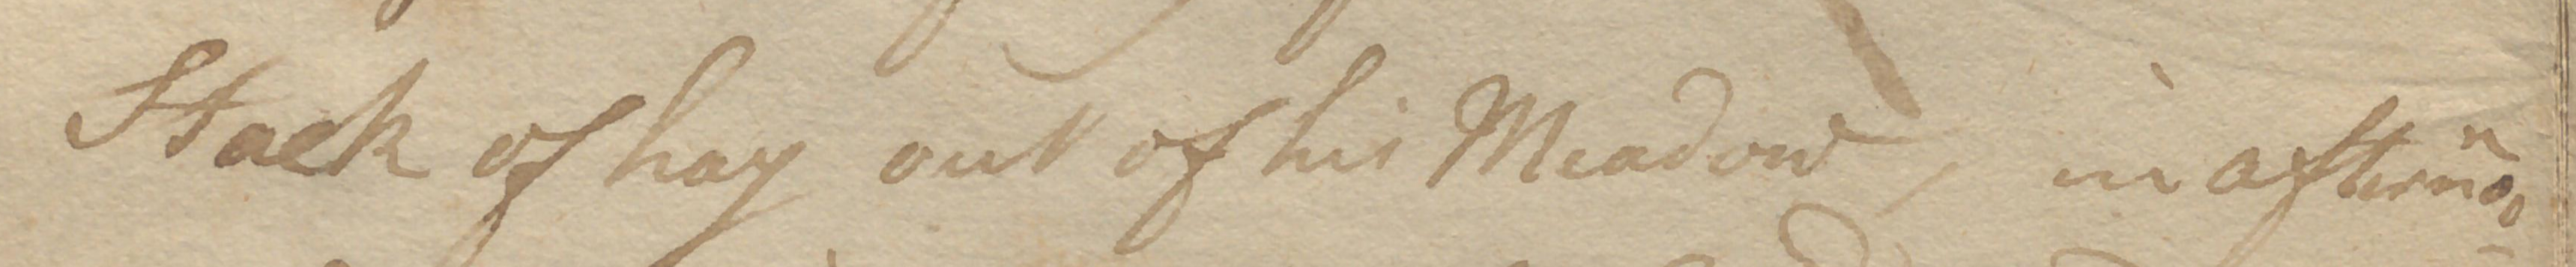Stack of hay out of his Meadow in afternoon
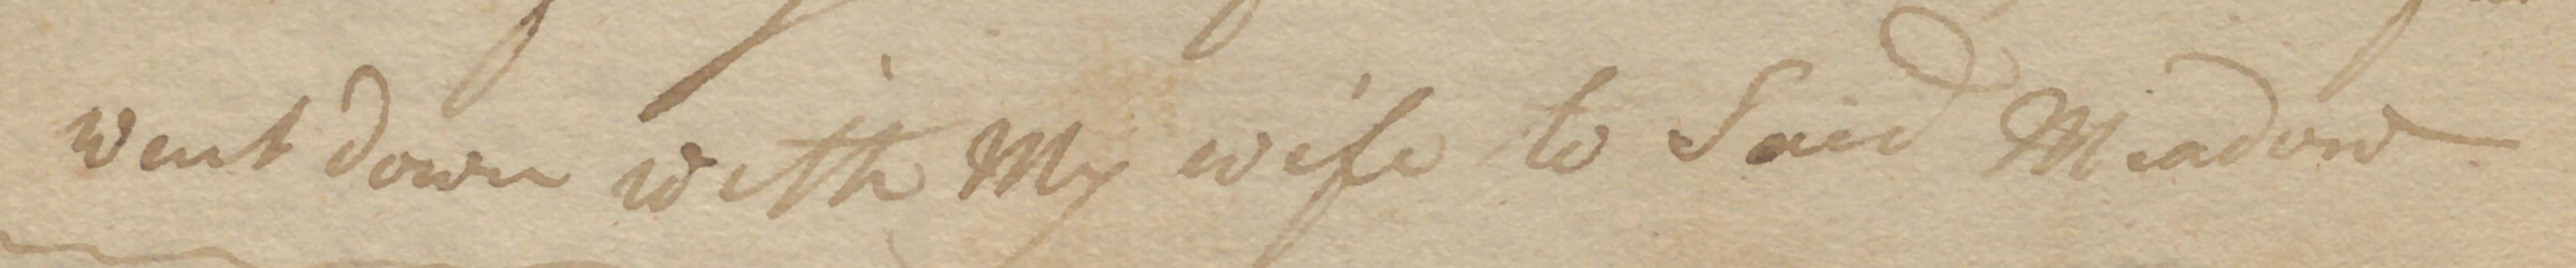went down with My wife to Said Meadow
